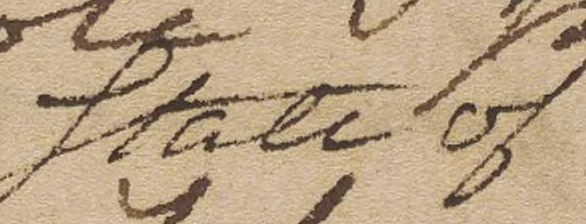state of
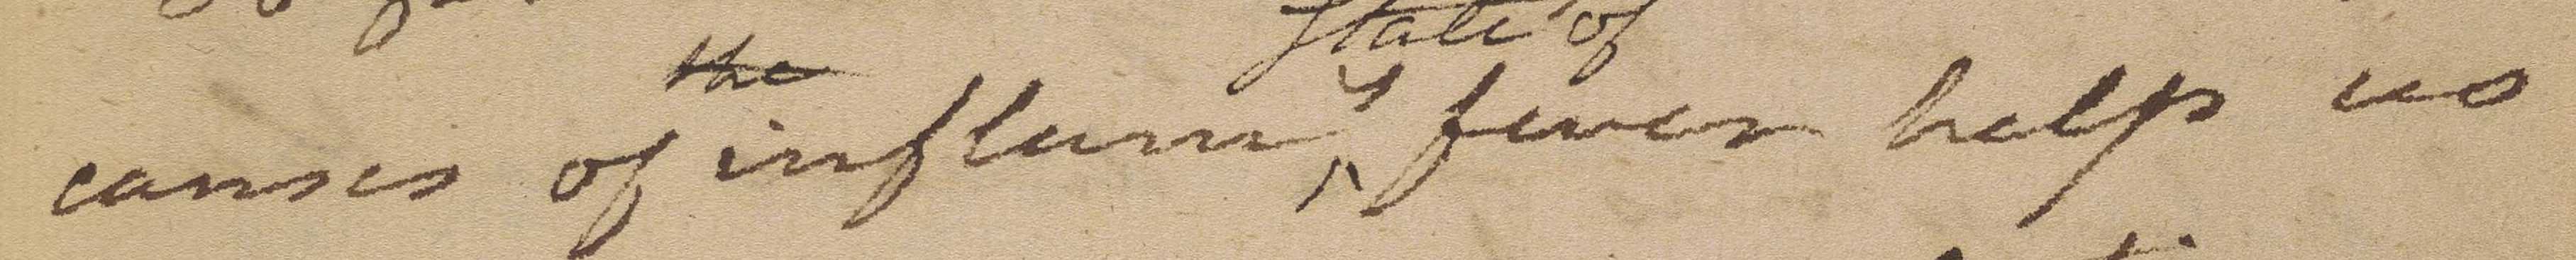causes of inflam^y fever help us
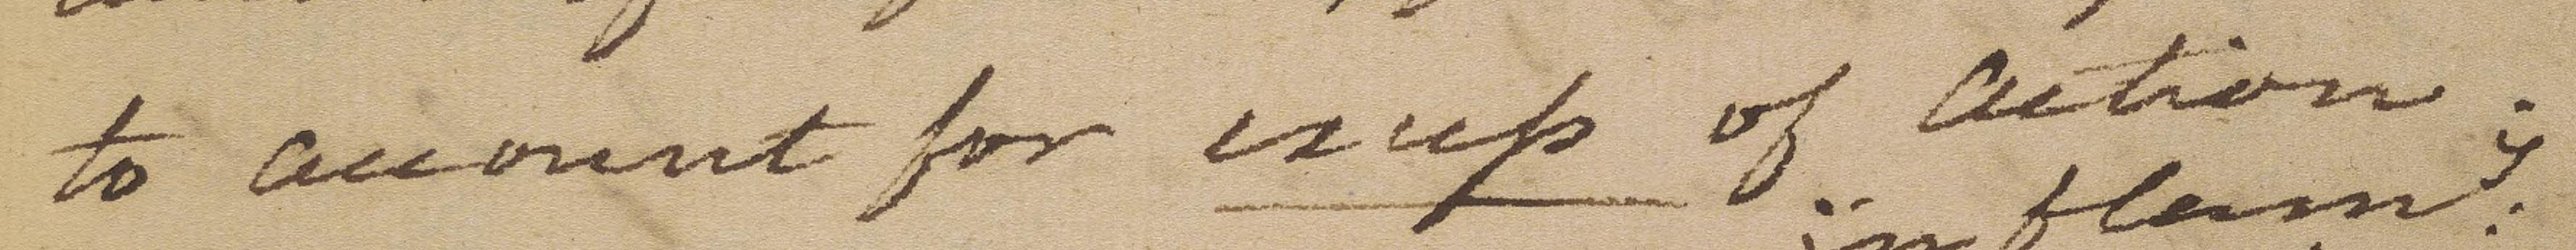to account for excess of action.
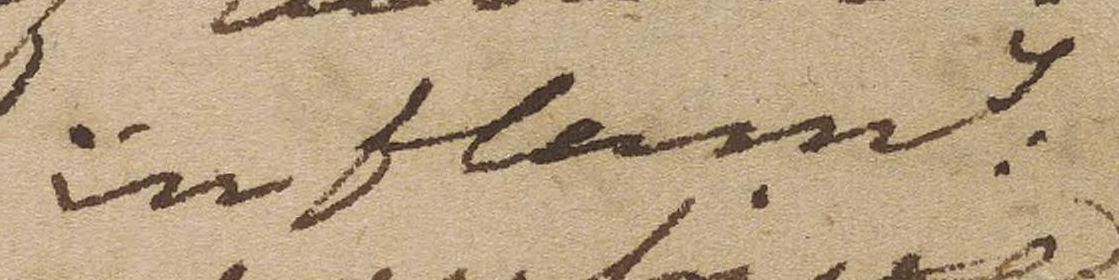inflam^y
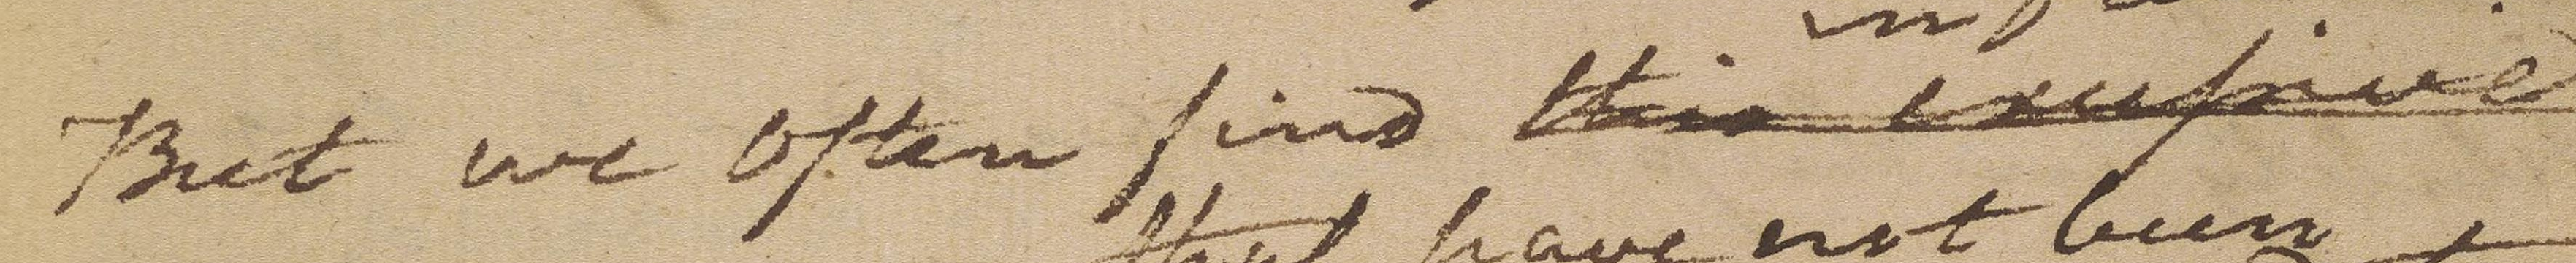But we often find [this excessive]
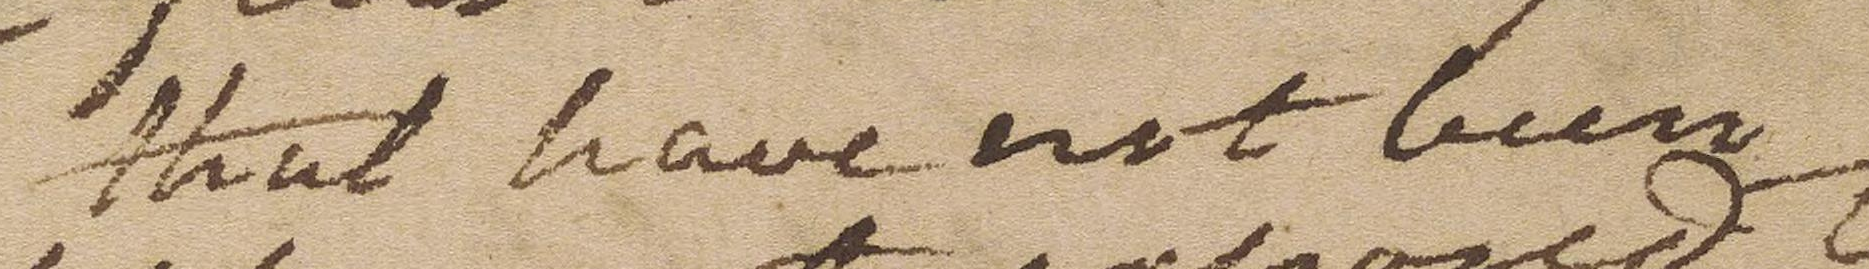that have not been
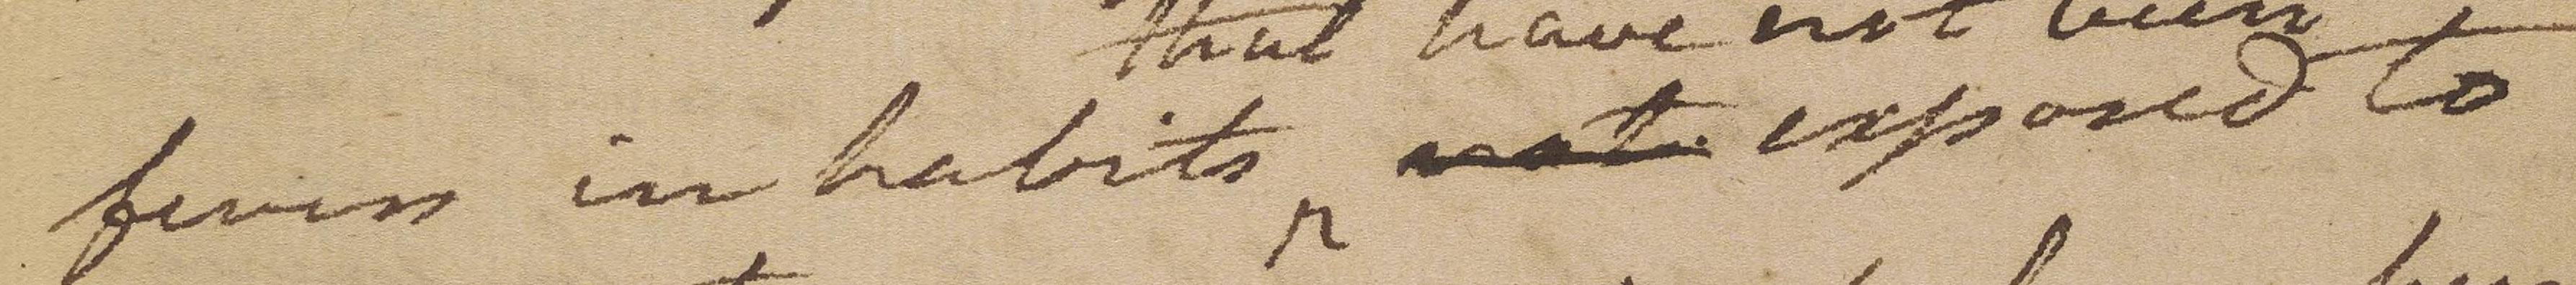fevers in habits ^ [not] exposed to
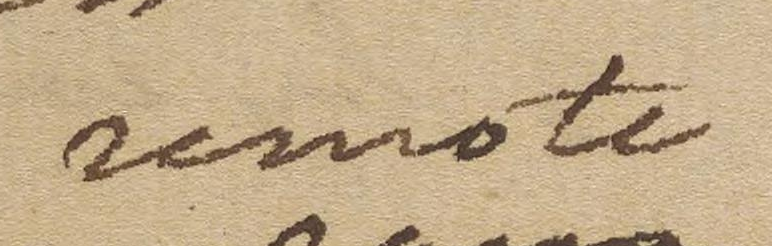remote
